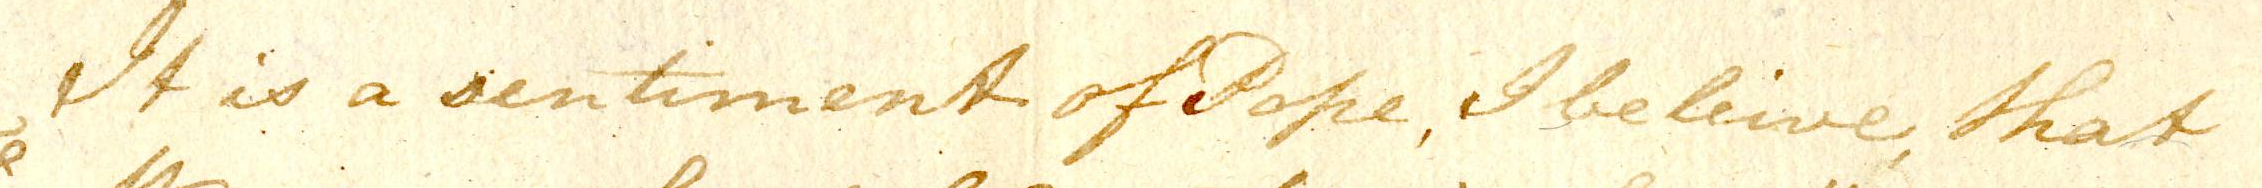It is a sentiment of Pope, I believe, that
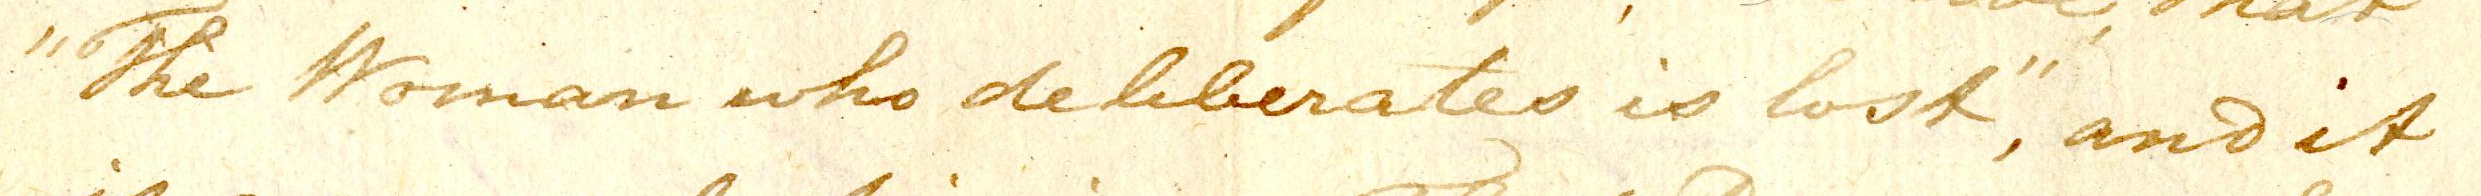"The Woman who deliberates is lost," and it
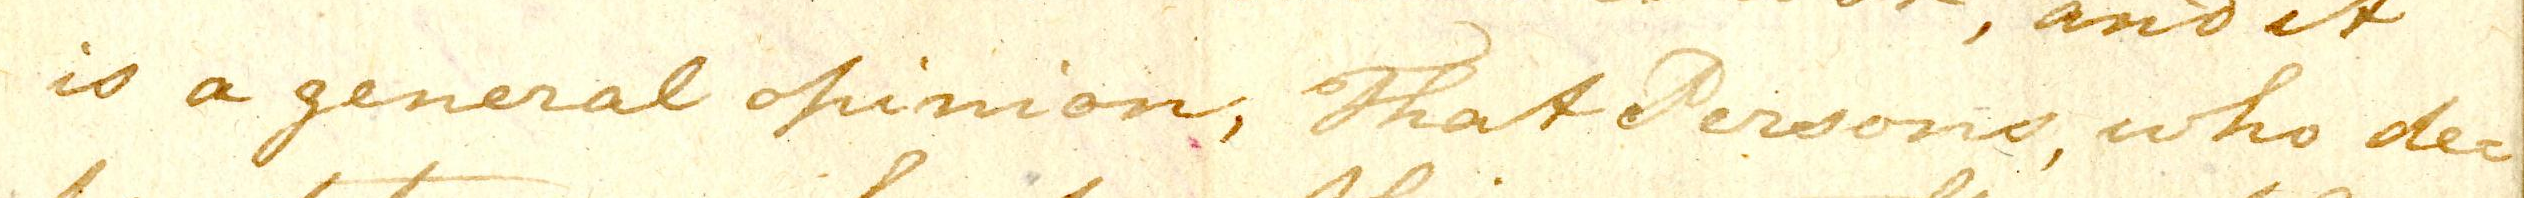is a general opinion, That Persons, who de-
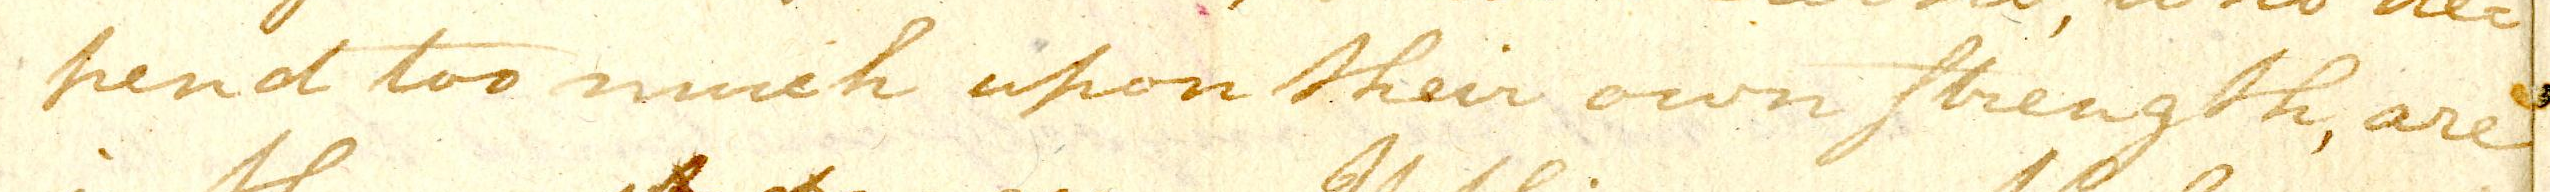pend too much upon their own strength, are
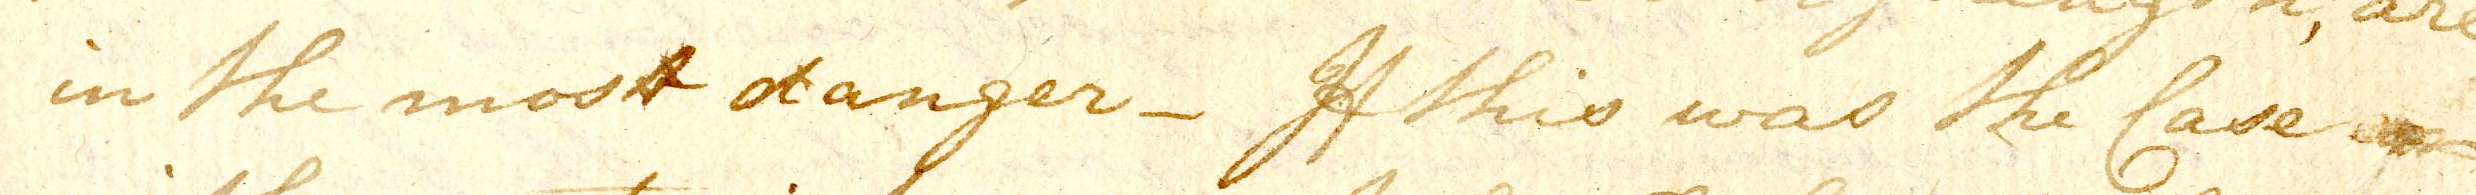in the most danger- If this was the Case
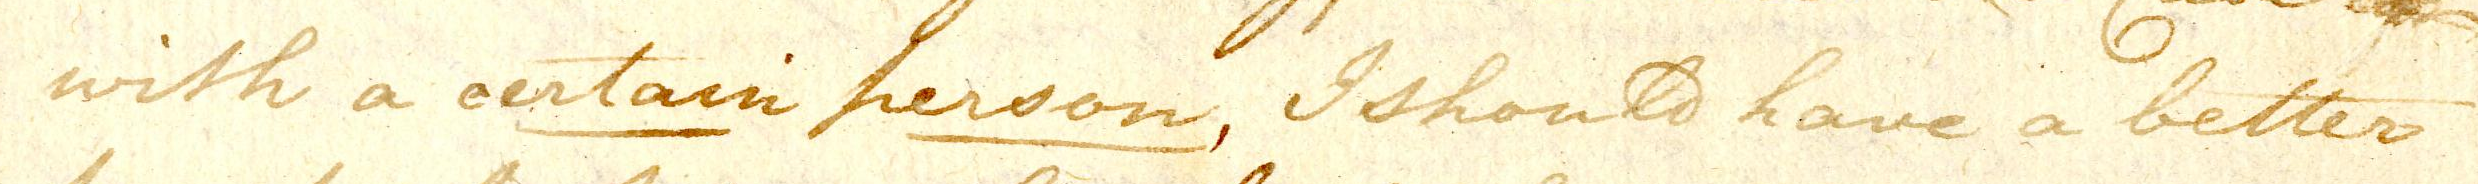with a certain person, I should have a better
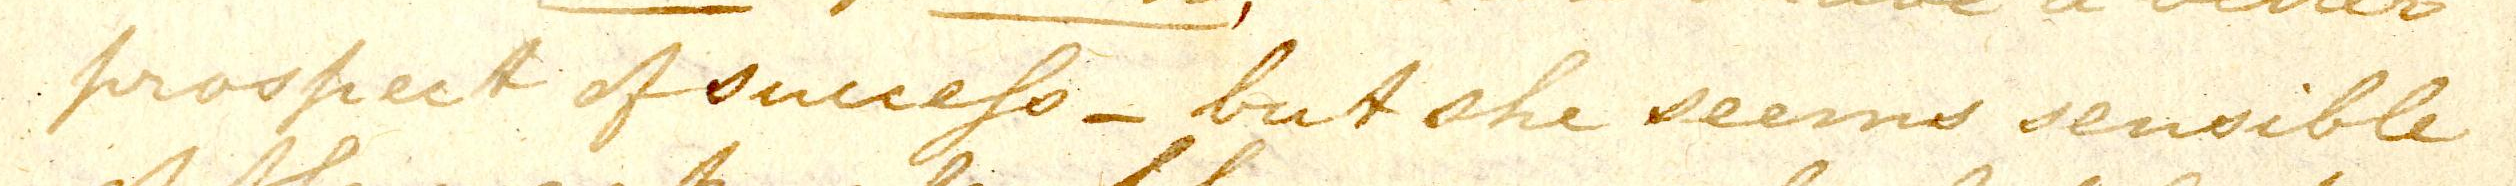prospect of success- but she seems sensible
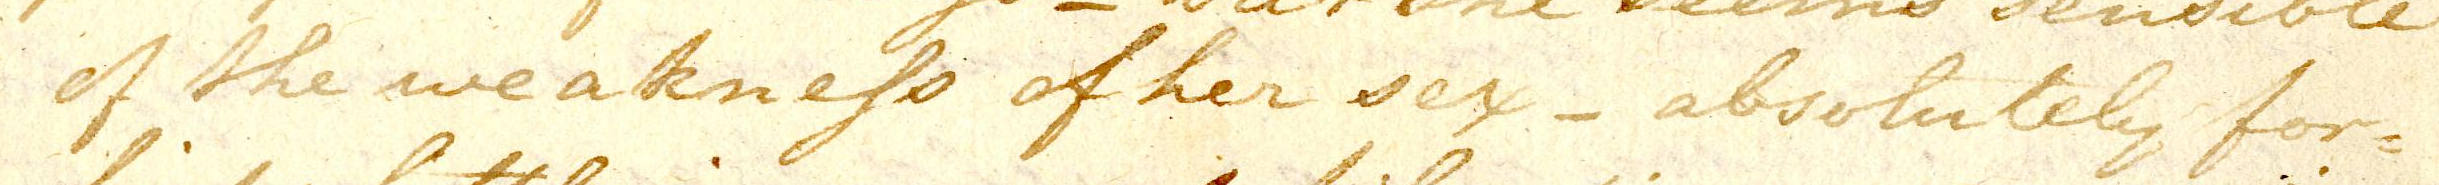of the weakness of her sex- absolutely for-
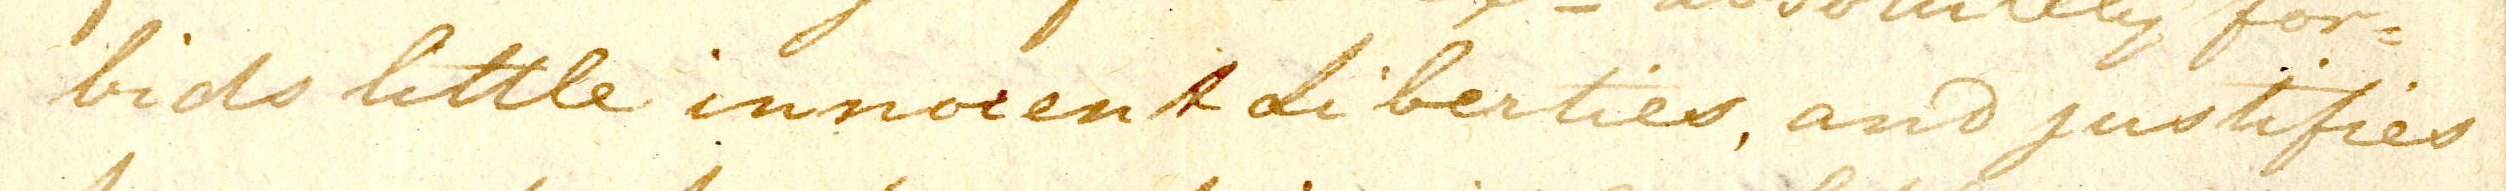bids little innocent Liberties, and justifies
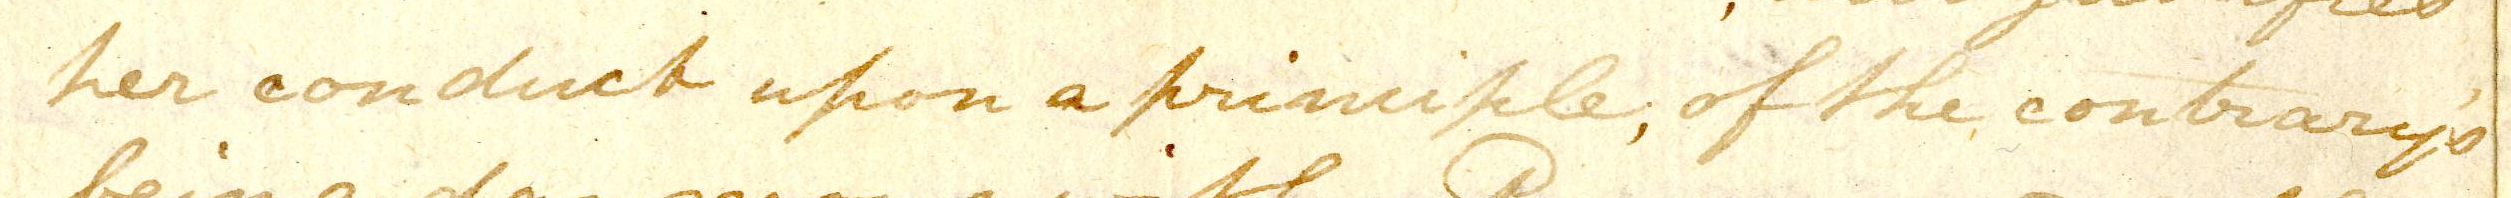her conduct upon a principle, of the contrary's
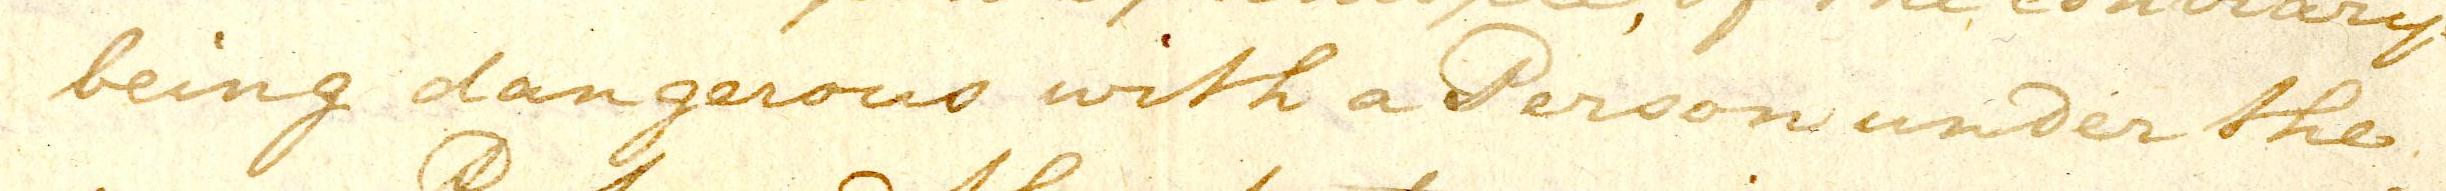being dangerous with a Person under the
